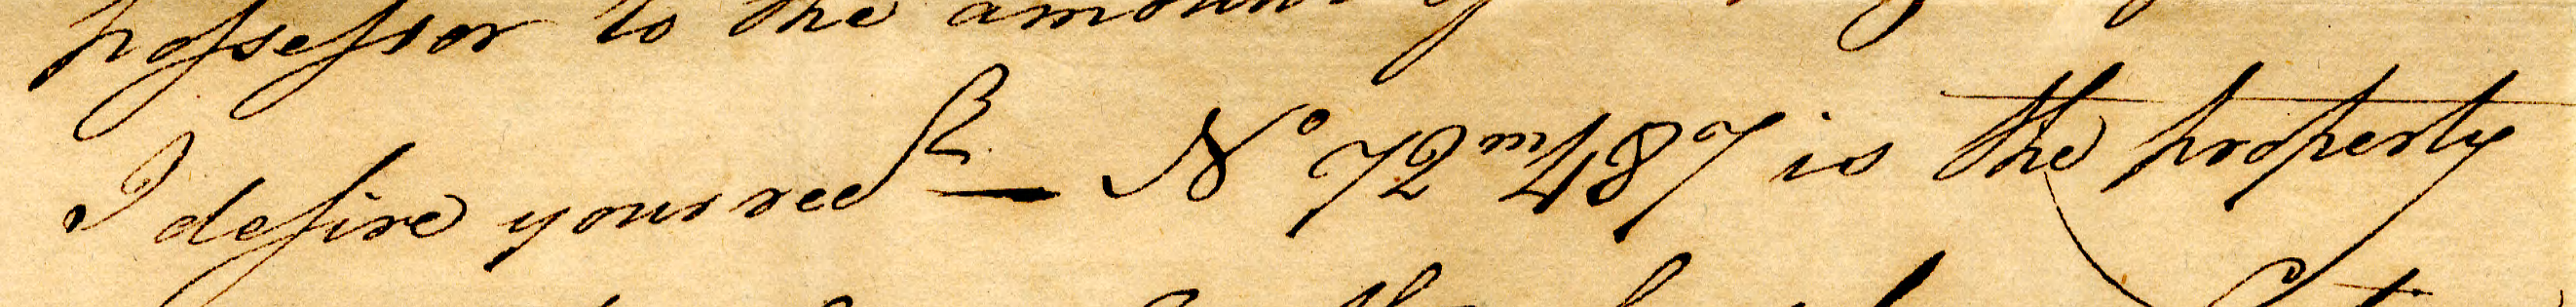I desire your rec^t- N^o 72^m487 is the property
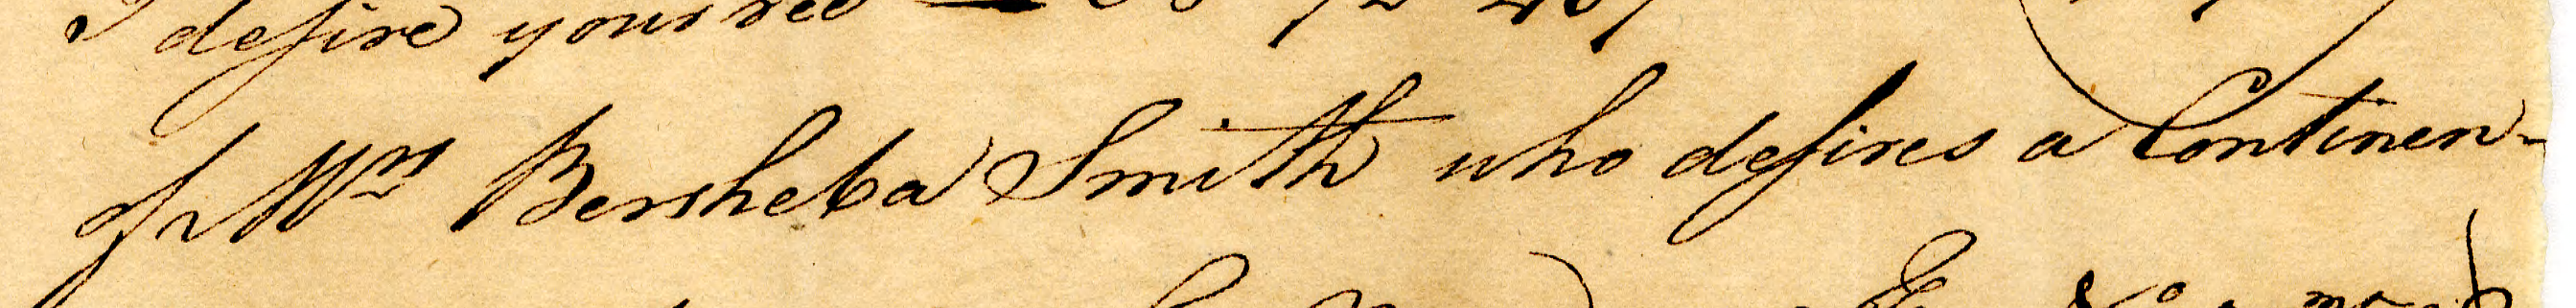of M^rs Besheba Smith who desires a Continen-
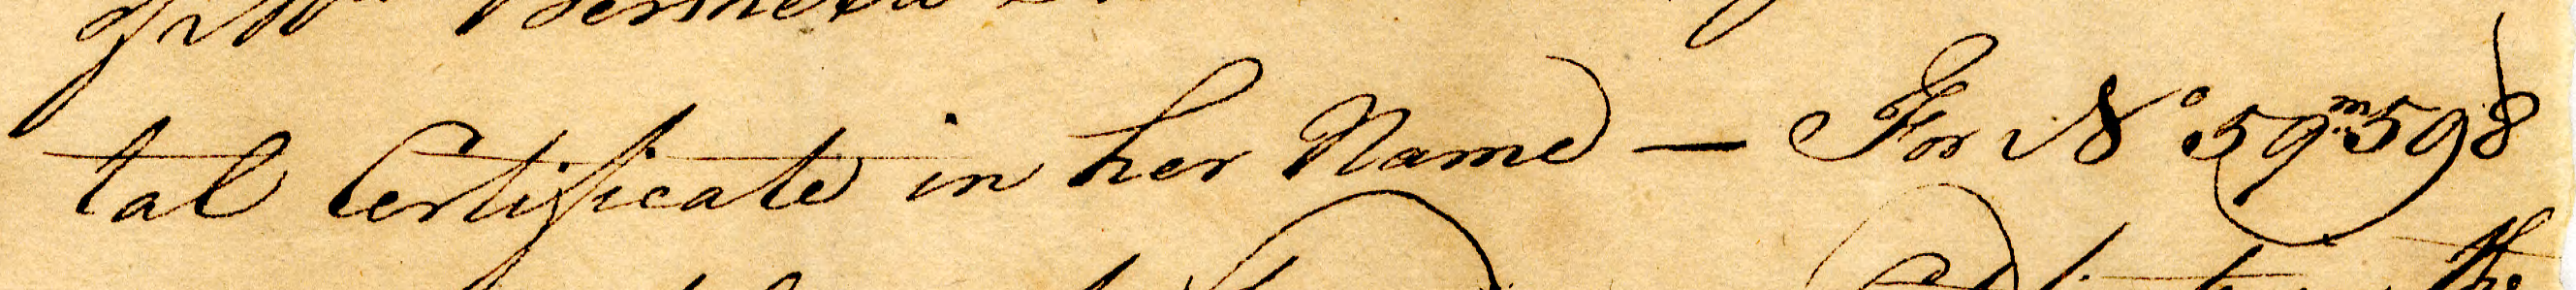tal Certificate in her name- For N^o 59^m598
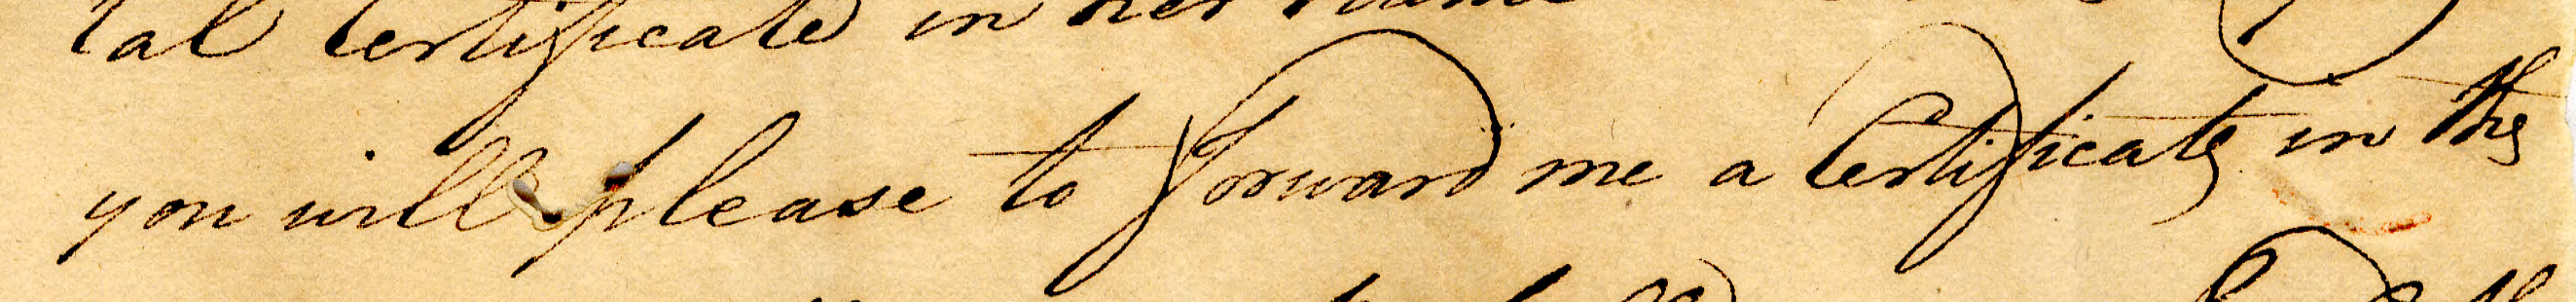you will please to Forward me a Certificate in the
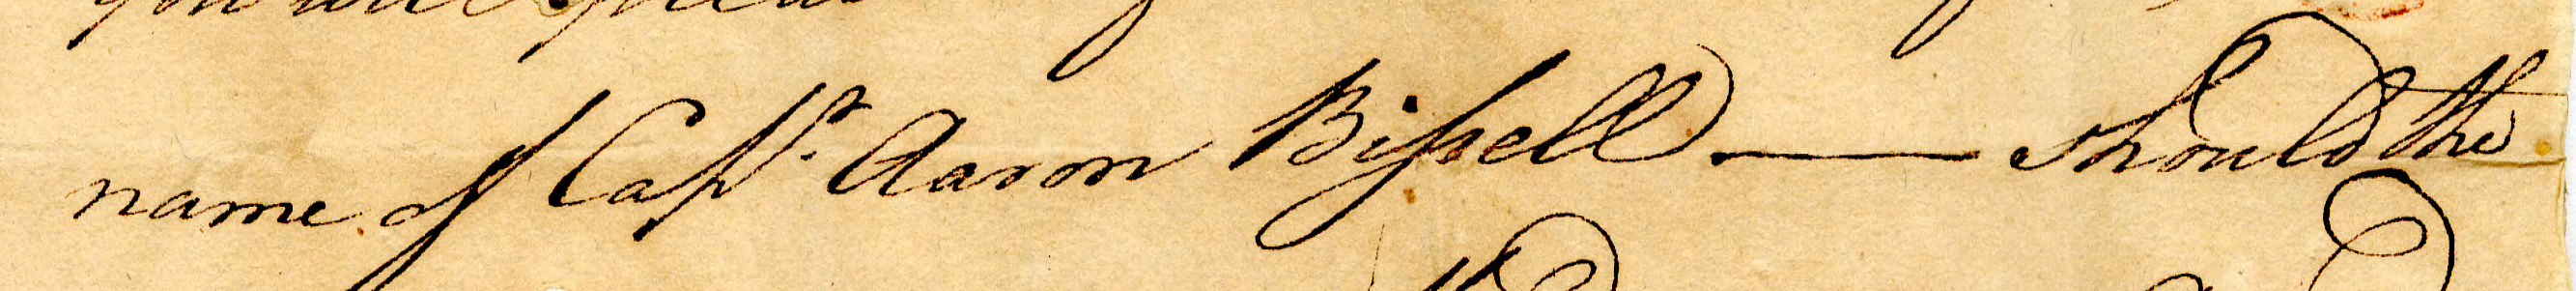name of Cap^t. Aaron Bisell- should the
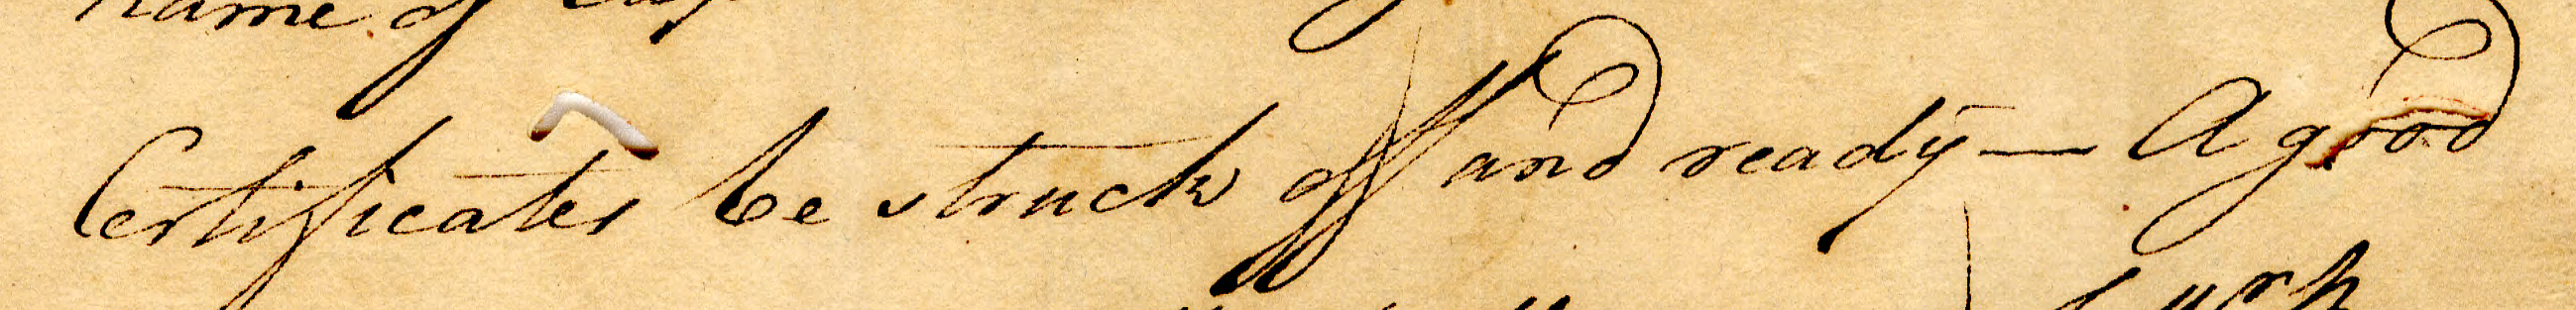Certificates be struck off and ready- A good
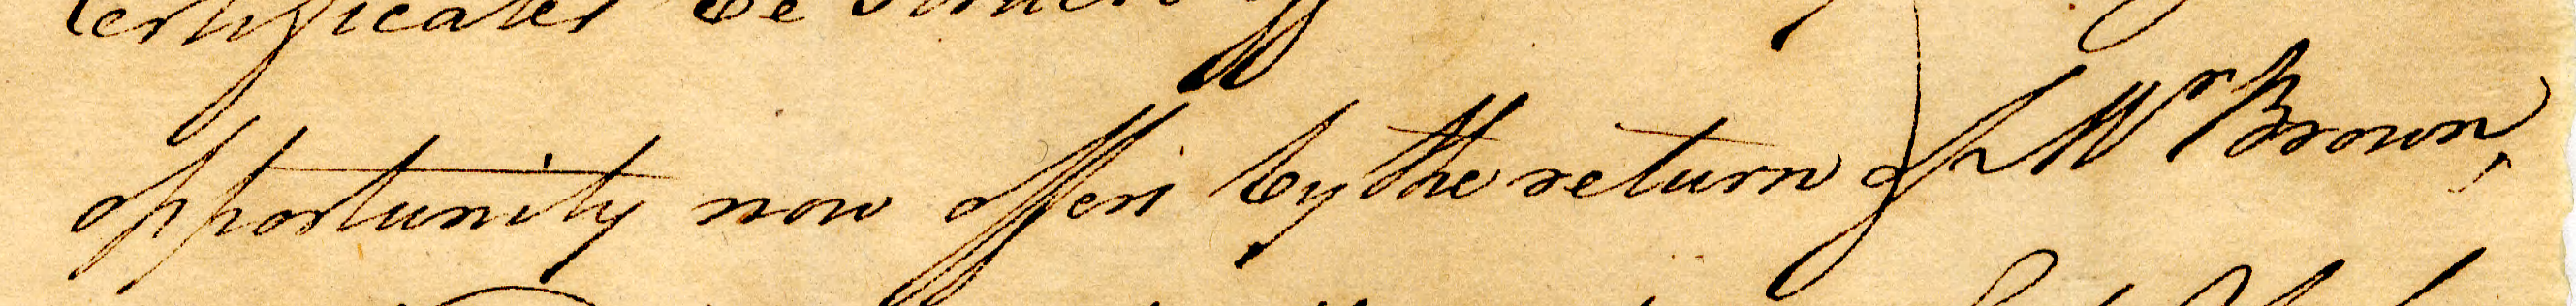opportunity now offers by the return of M^r Brown
